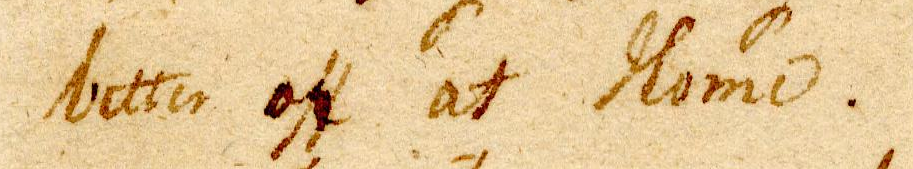better off at Home.
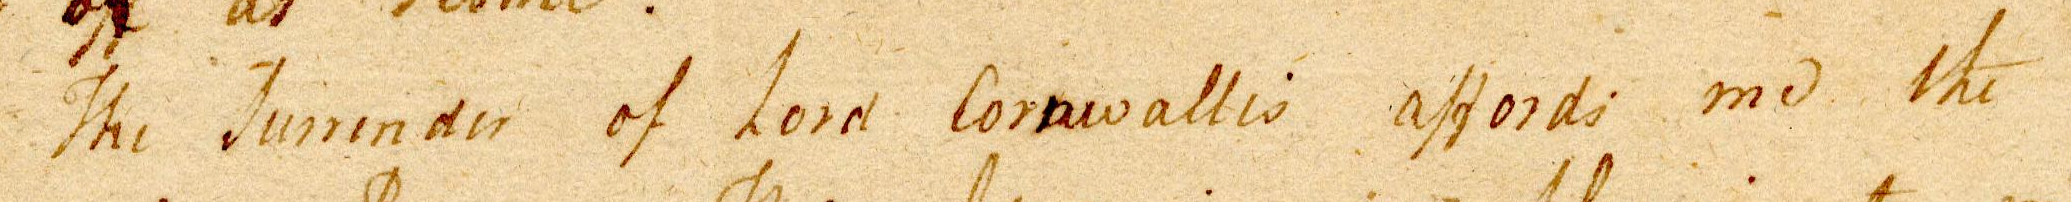The Surrender of Lord Cornwallis affords me the
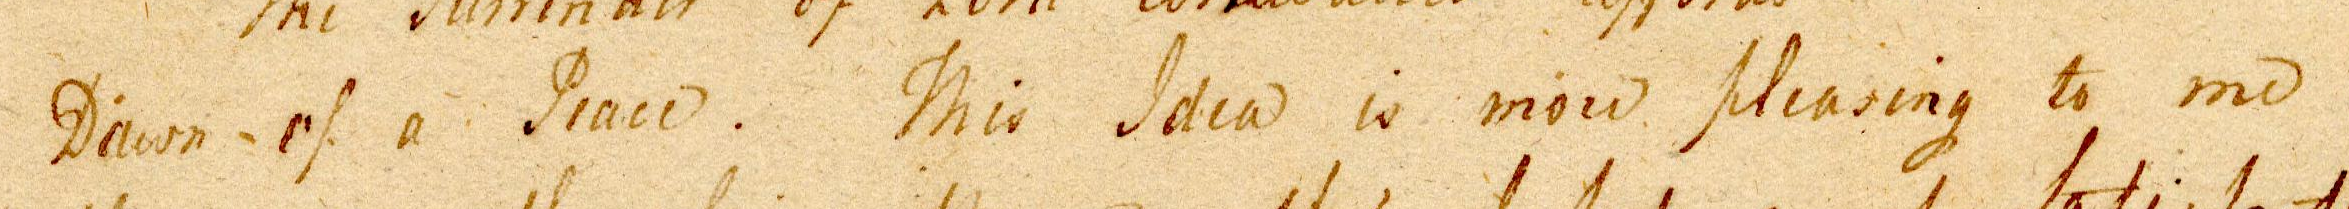Dawn of a Peace. This Idea is more pleasing to me
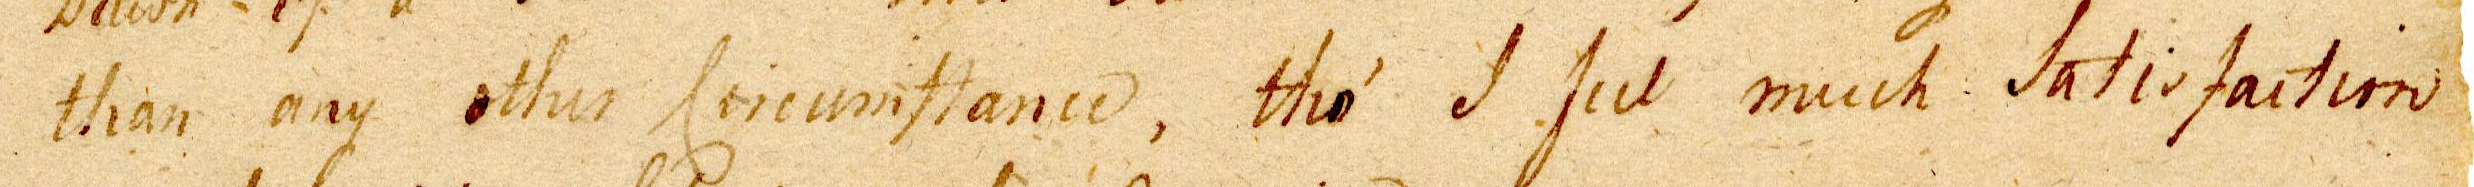than any other Circumstance, tho' I feel much Satisfaction
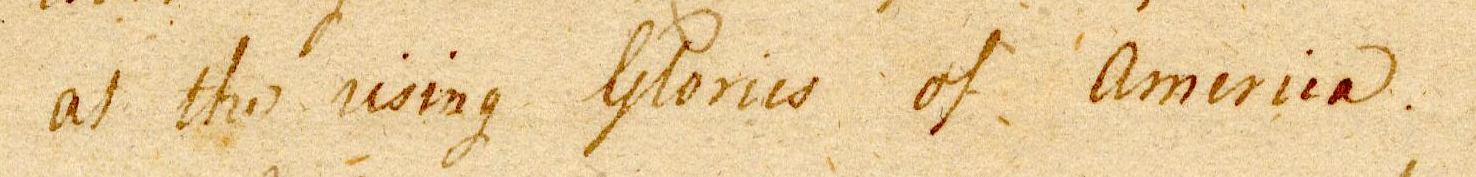at the rising Glories of America.
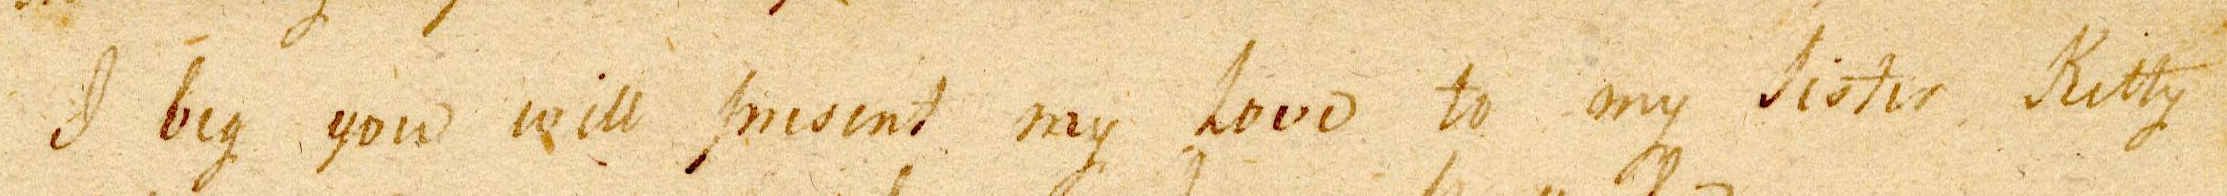I beg you will present my Love to my Sister Kitty
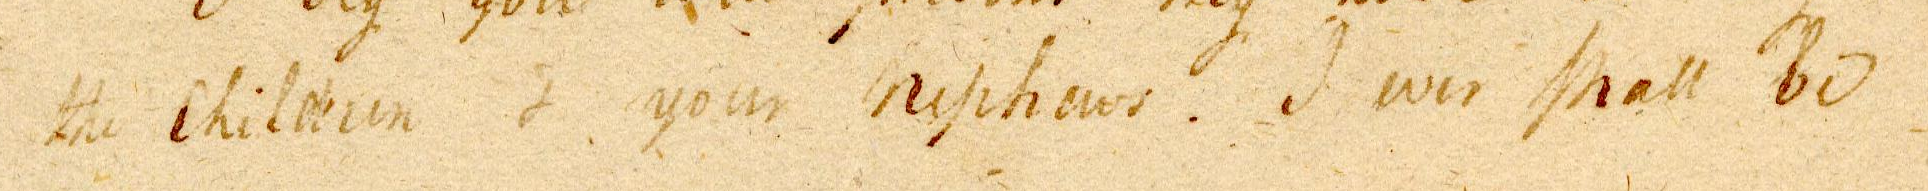the Children & your nephews. I ever shall be
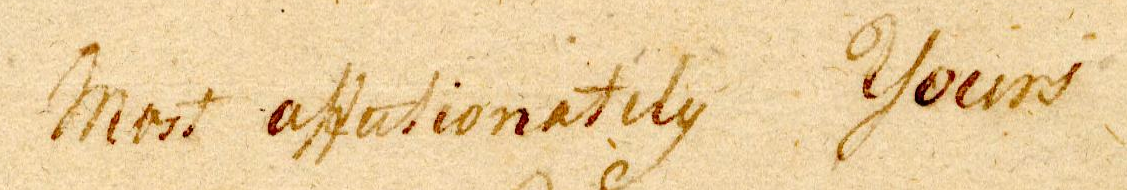Most affectionately Yours
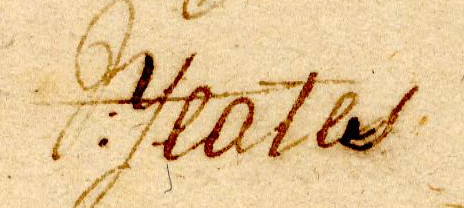J. Yeates
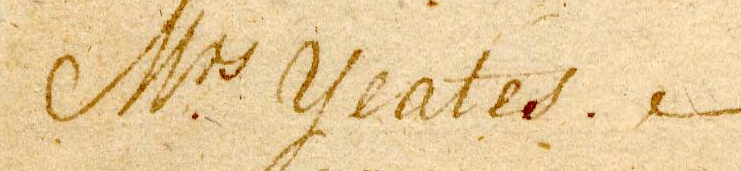M^rs. Yeates
